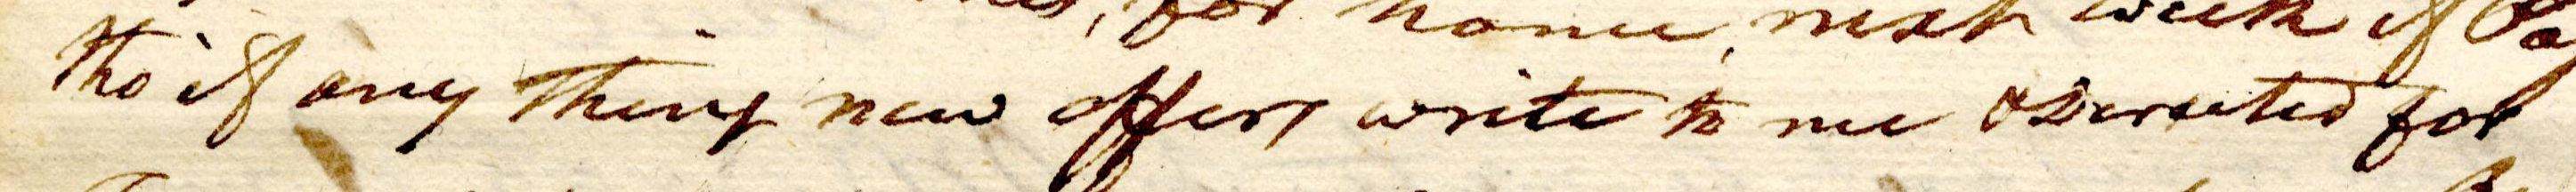tho if my things new offers write to me & Directed for
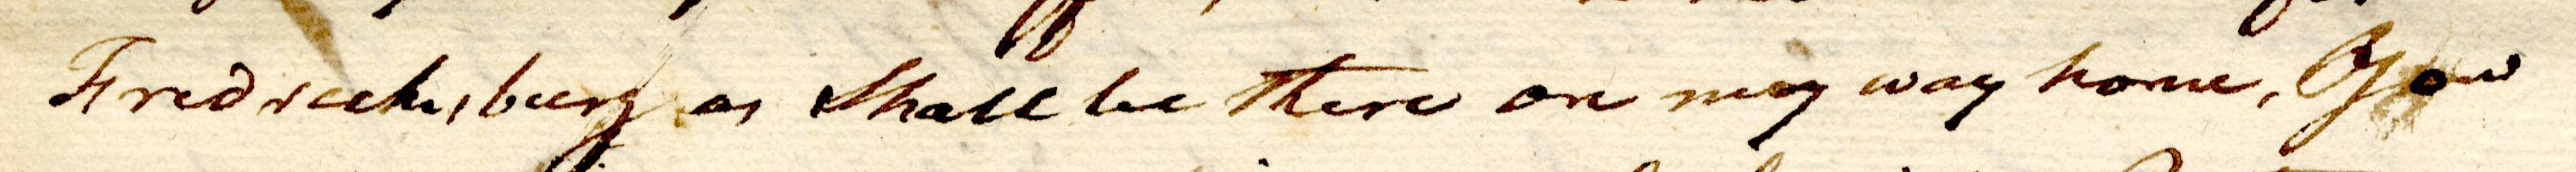Fredericksburg as shall be there on my way home, you
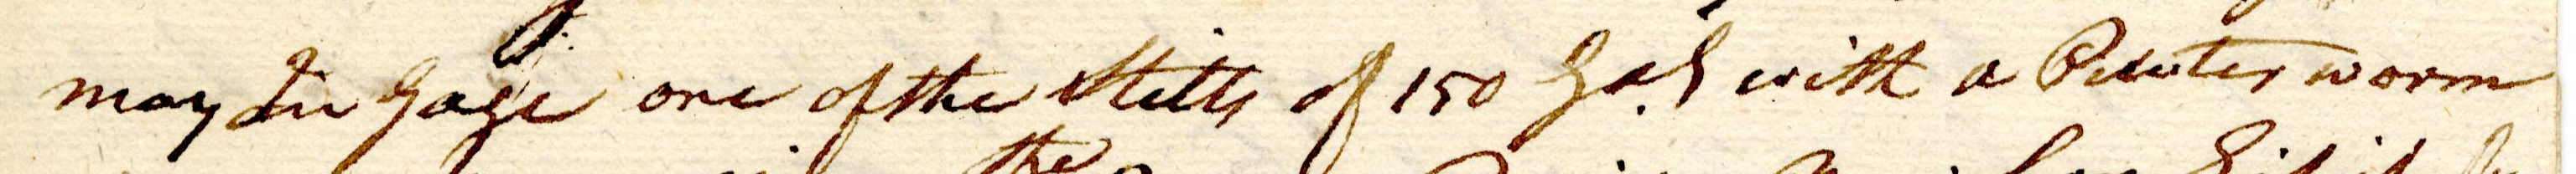may Ingage one of the Stills of 150 Gal with a Pewter worm
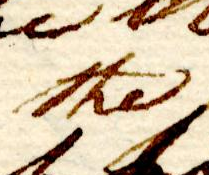the
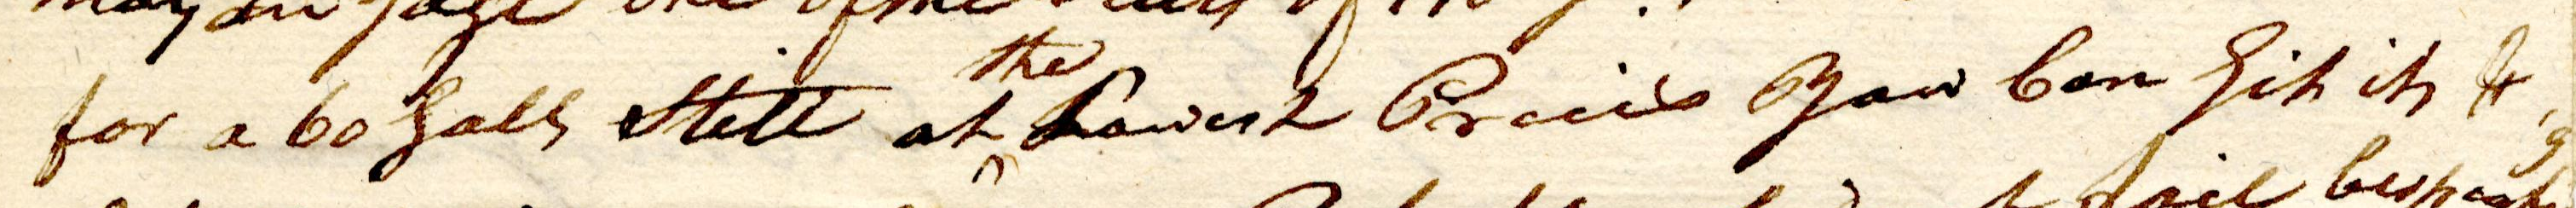for a 60 Gall still at ^ lowest price you can git it for`
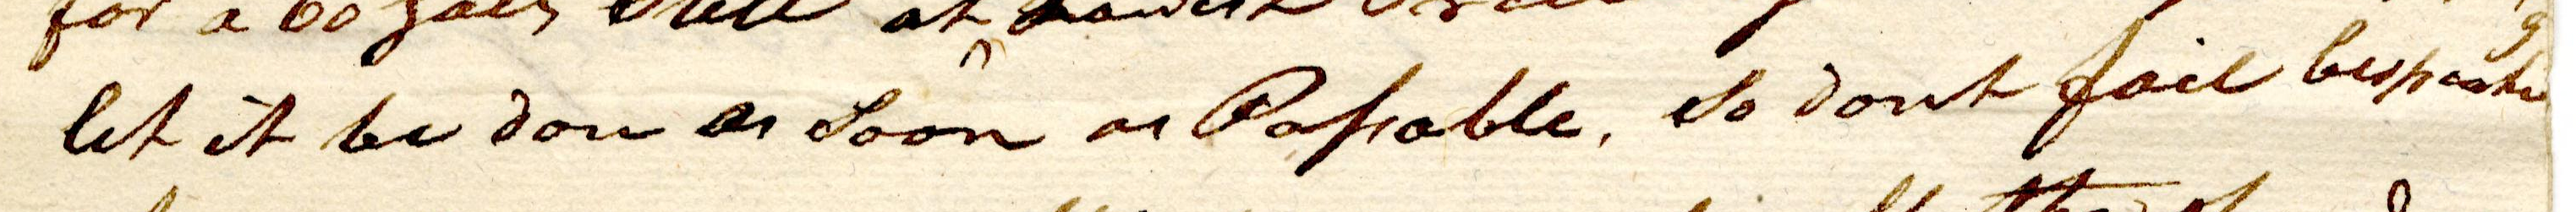let it be don as soon as Possable, so dont fail bespeake
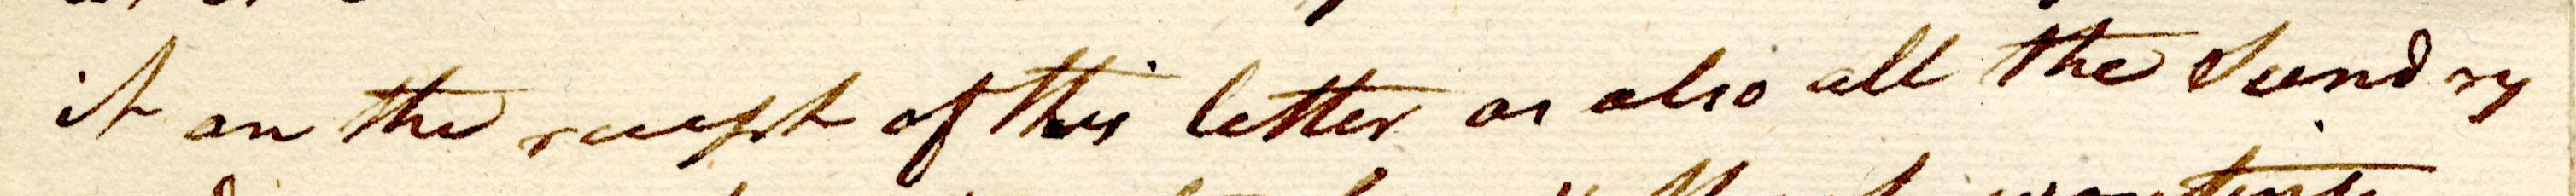if on the recept of this letter as also all the Sundry
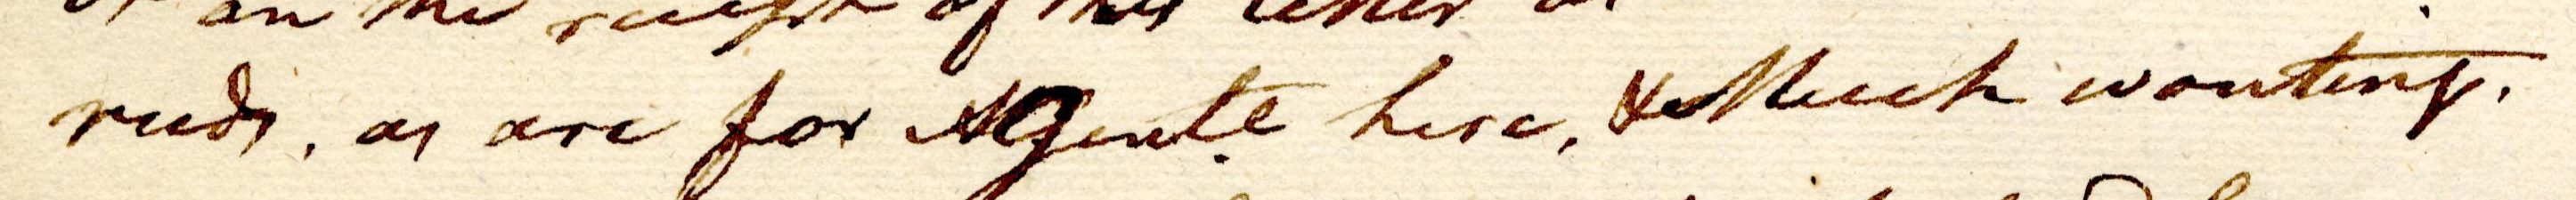reeds, as are for Aquete here, & Much wanting
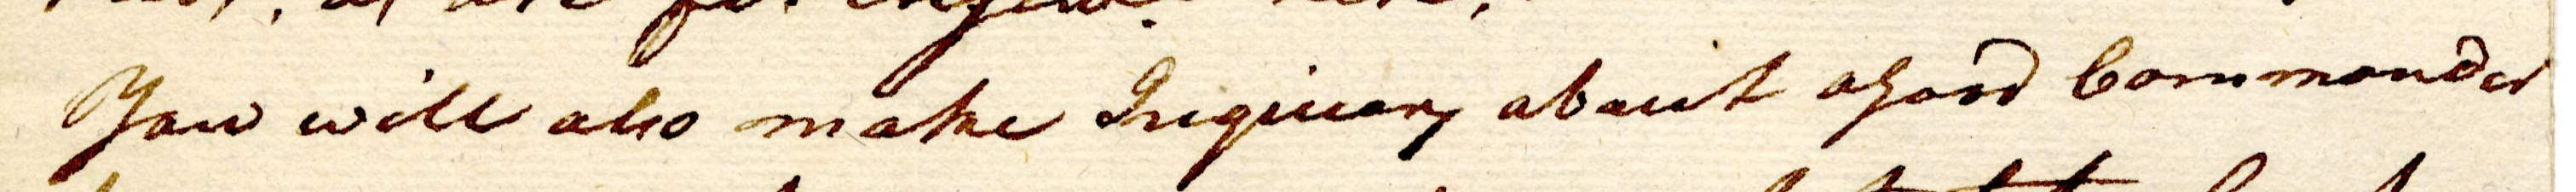you will also make Inquiries about a good Commander
